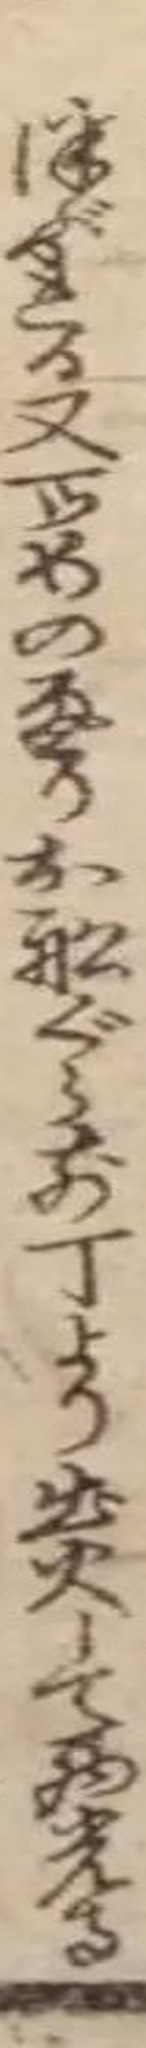潰ぶれる又めの通りお舩ぐら前丁より出火して西光寺
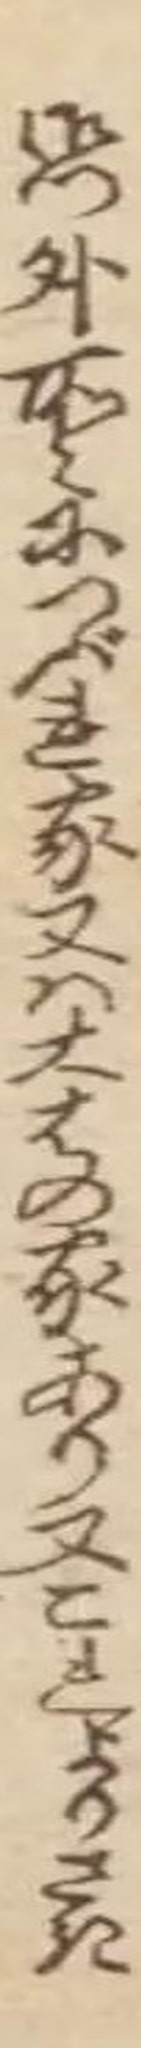御門外所々につぶれ家又は大はの家あり又これよりさき
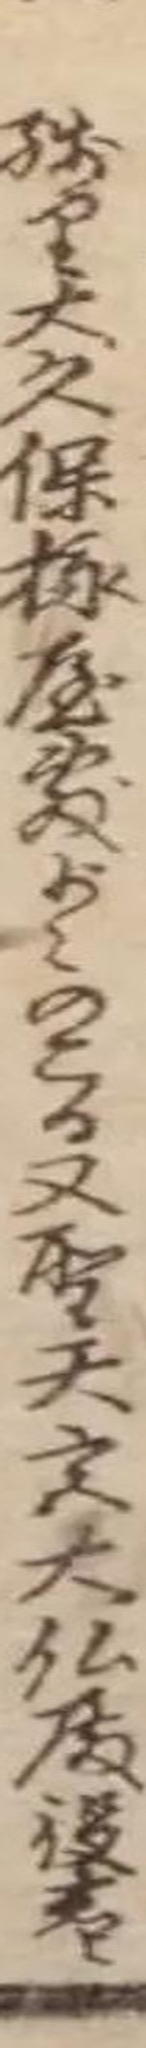残り大久保様屋敷少々のこる又聖天宮大仏殿壱
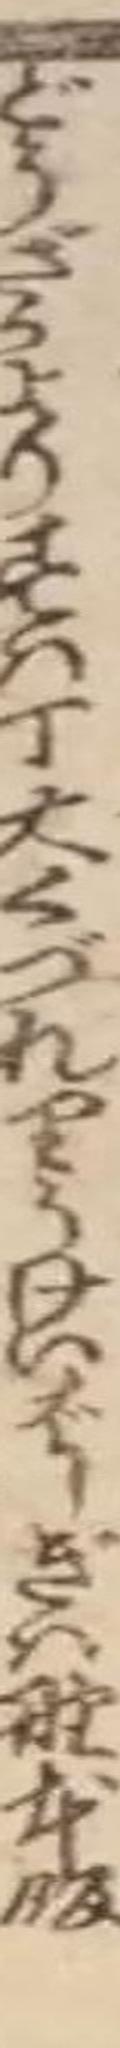どうざかよりすは丁大くづれりうけいばしぎは野本飯
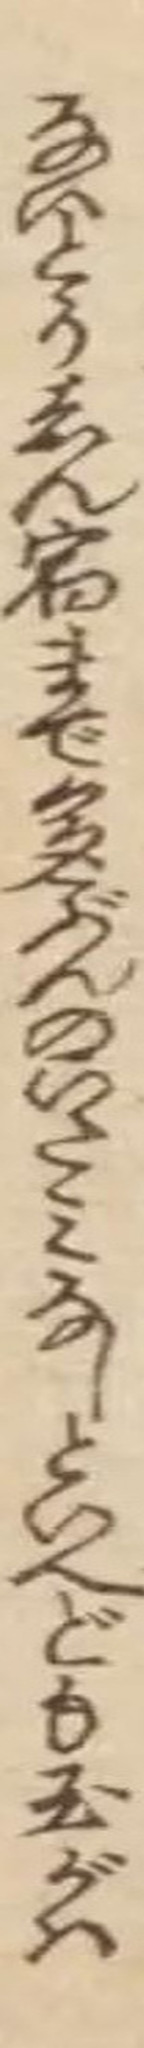ないとうしん宿まで多ぶんのいたみなしといへども玉がは
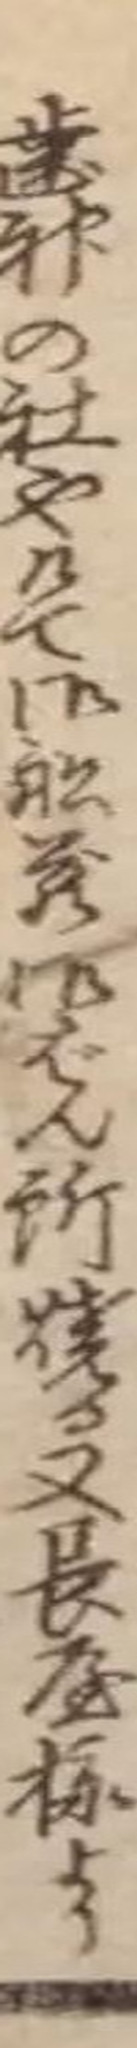歯神の社やけて御舩蔵御ばん所焼る又長屋様より
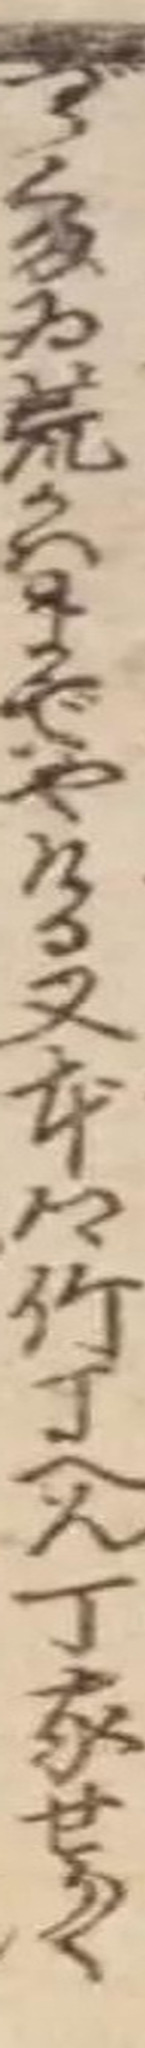づかくまゐ荒かはまでやける又本郷竹丁へん丁家せう〳〵
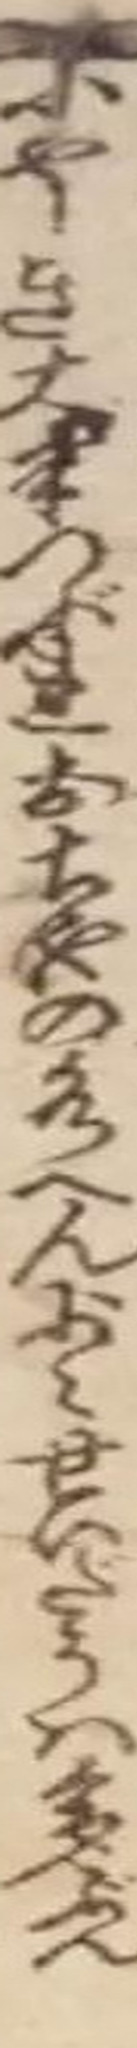小やしき大半つぶれおちやの水へん少〻せいどうは多ぶん
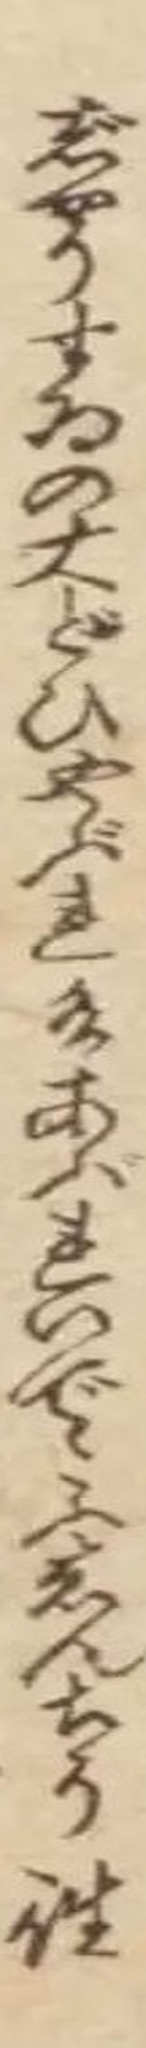じやうすゐの大どひやぶれ水あふれいでゝふしんちう往
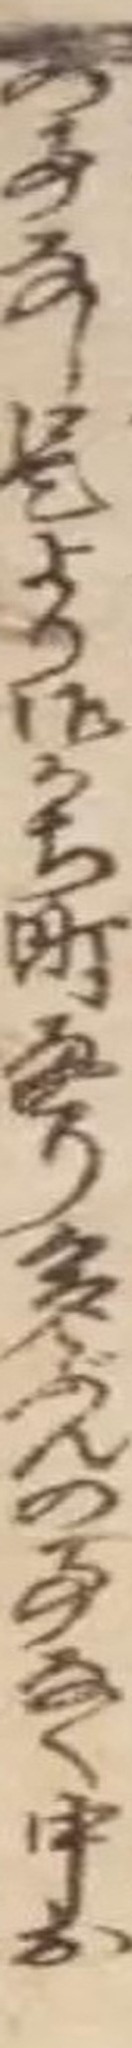の事なし是より御かち町通り多ぶんの事なく中お
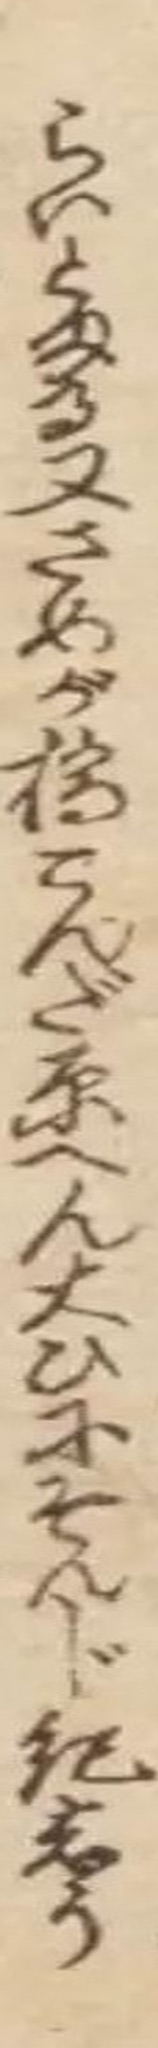らいとまる又さめが橋こんだ原へん大ひにそんじ紀しう
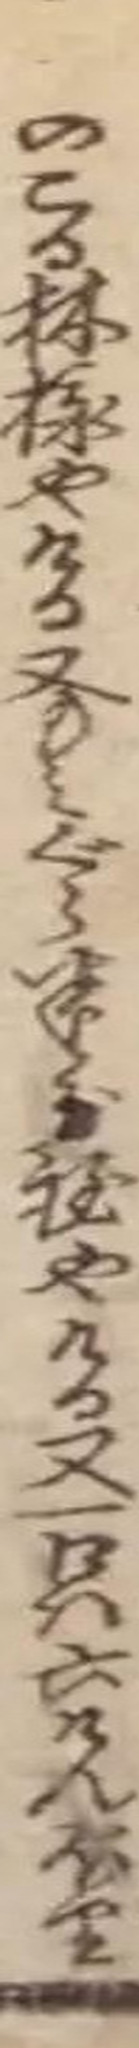のこる林様やける又もみぐら半程やける又一口は六けんぼり
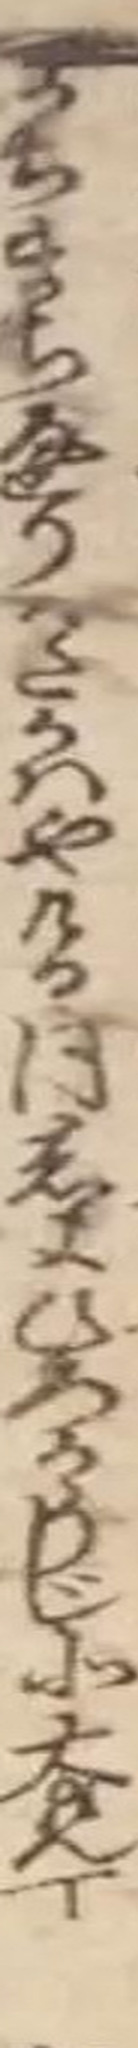かちまち通りかたかはやける同しよひろこうじ北大もん丁
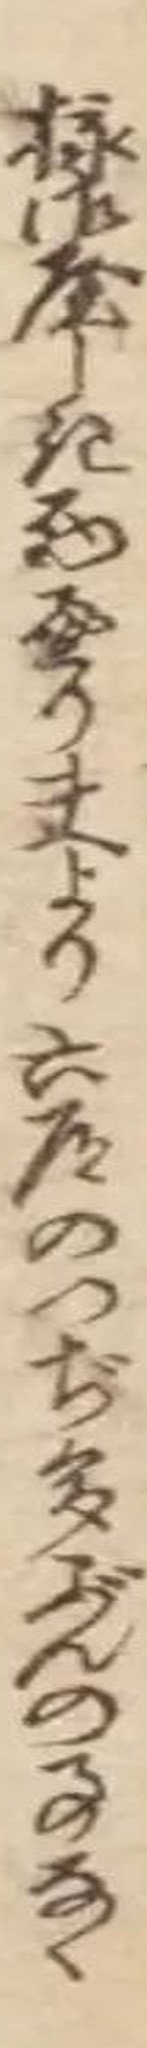様御屋しき西通り夫より六道のつぢ多ぶんの事なく
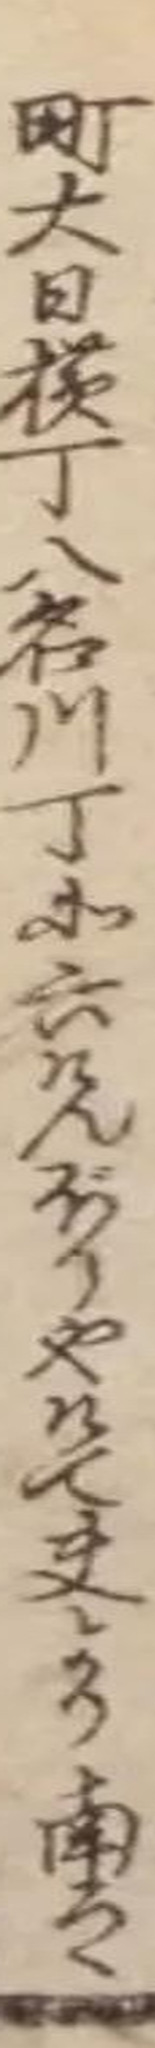町大日横丁八名川丁北六けんぼりやけて夫より南ろく
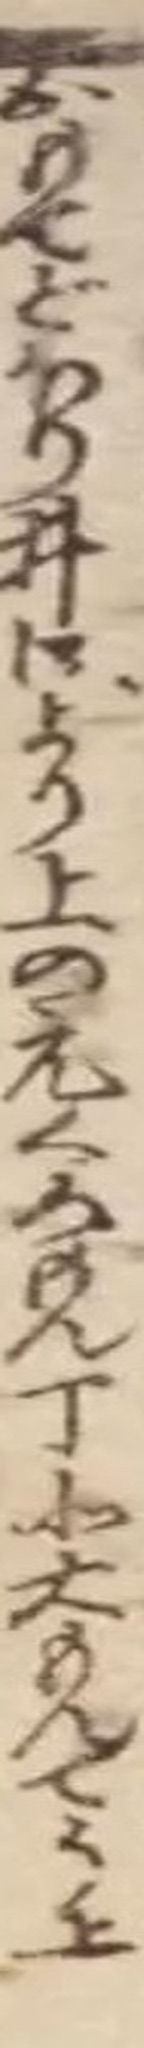おもてどほり井口より上の元くろもん丁北大もんてう上
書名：関東大地震末代鑑
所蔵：国立国会図書館 National Diet Library, JAPAN
